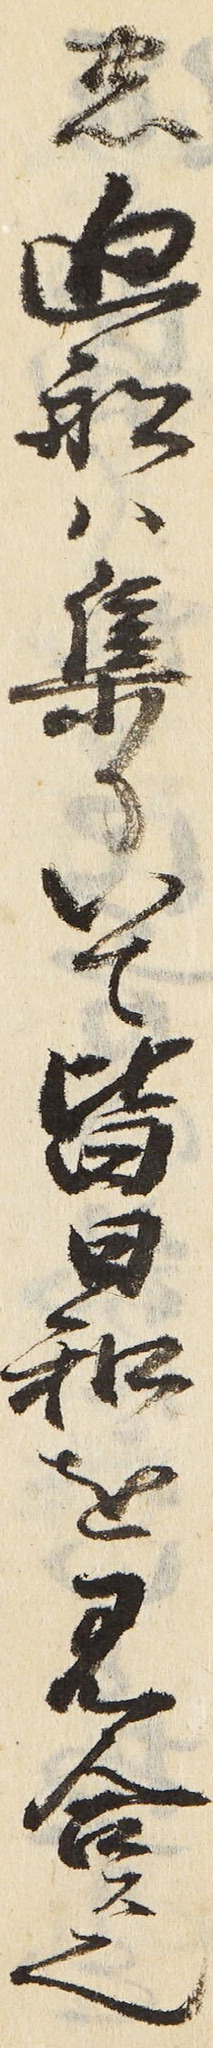の廻船は集りいて皆日和を見合ス也
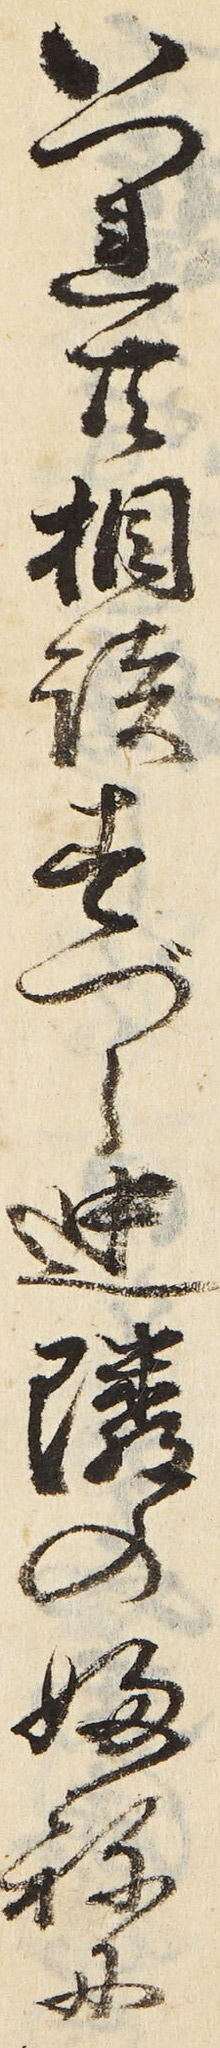いつれ共相談すべし迚隣のふねに
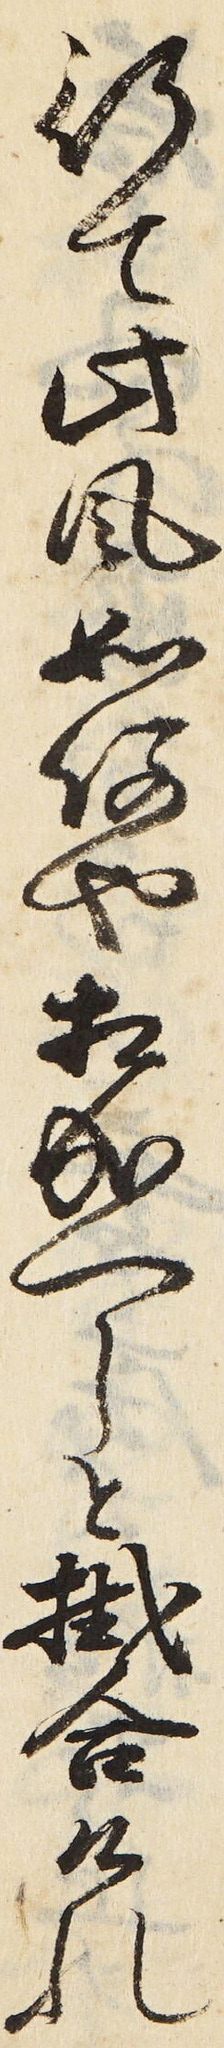行て此風如何や相成へしと掛合けれ
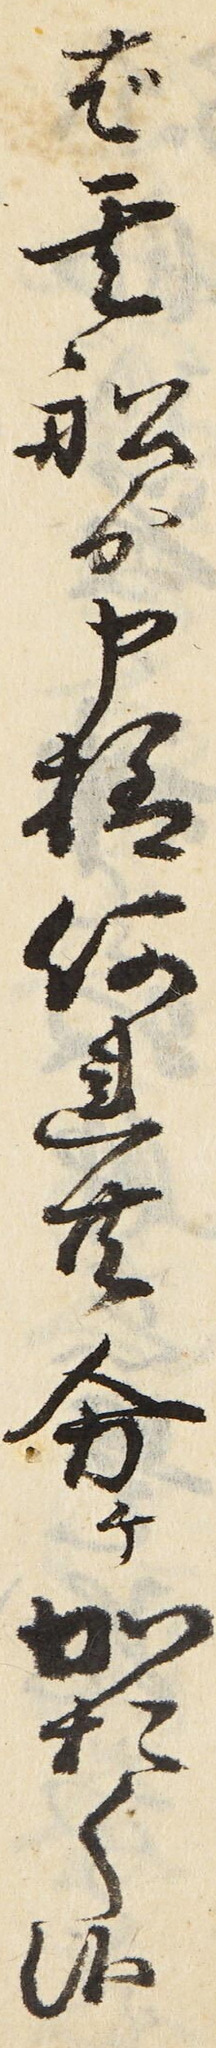ば其船ゟ申様何れ共分ちかたく候
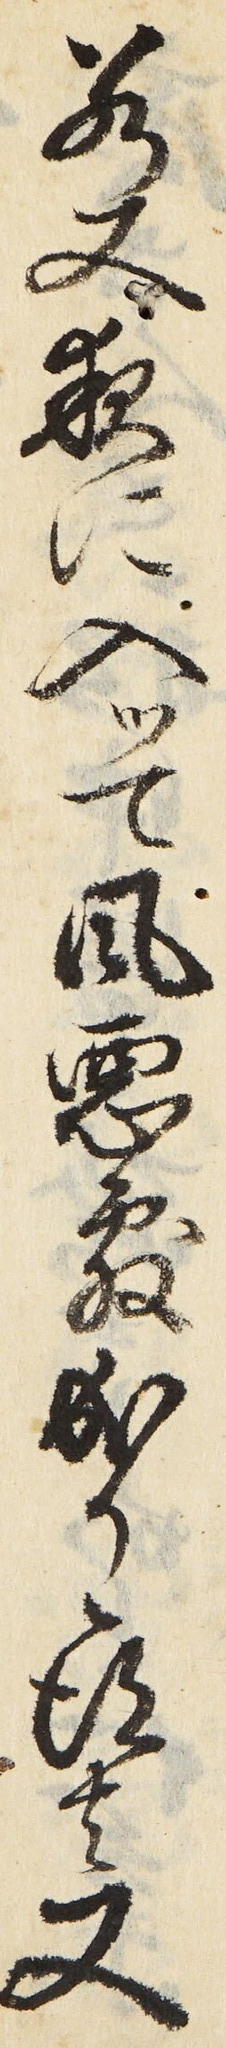若又夜に入つて風悪敷成り候得は又
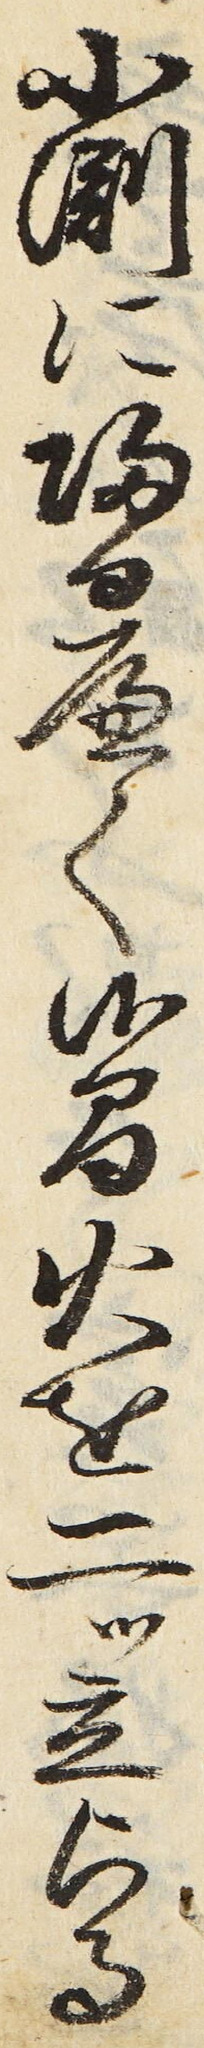小渕に帰るへく候間火を二つ立らる
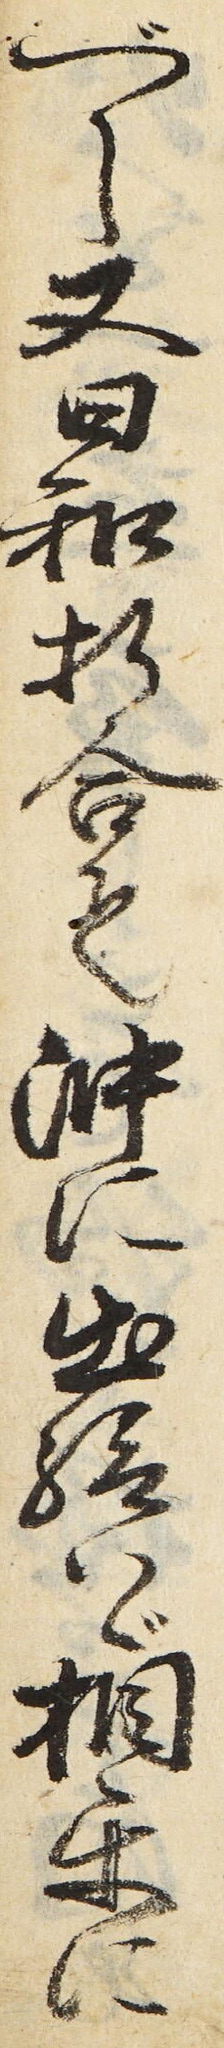べし又日和折合て沖に出給はば相互に

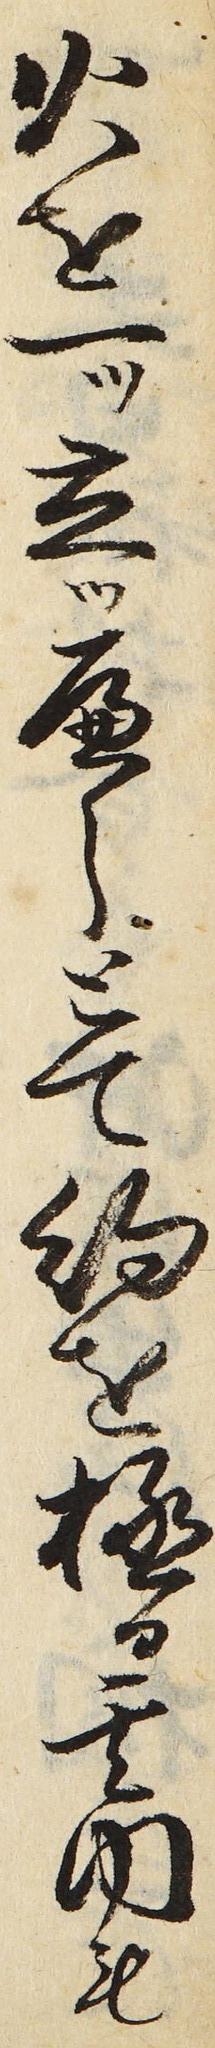火を一つ立つへしとて約を極る其内も
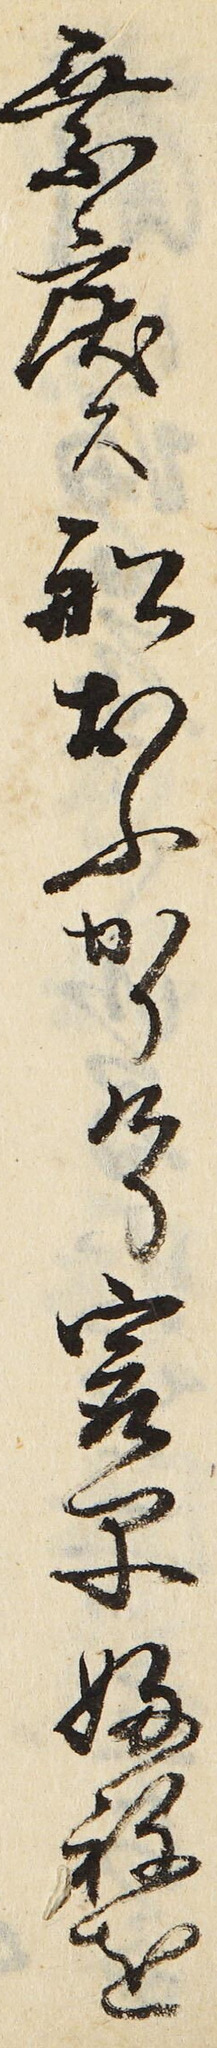乗戻す船おふかりけり最早ふねを
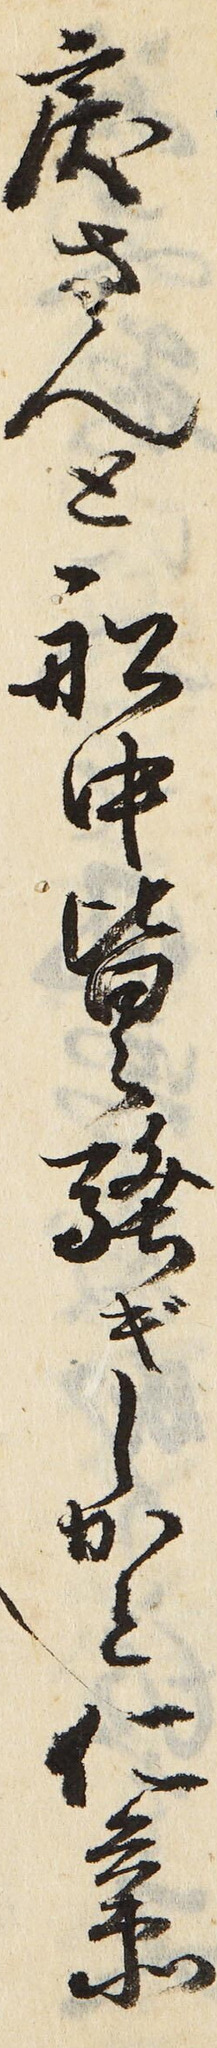戻さんと船中皆々騒ぎしかと仁兵衛
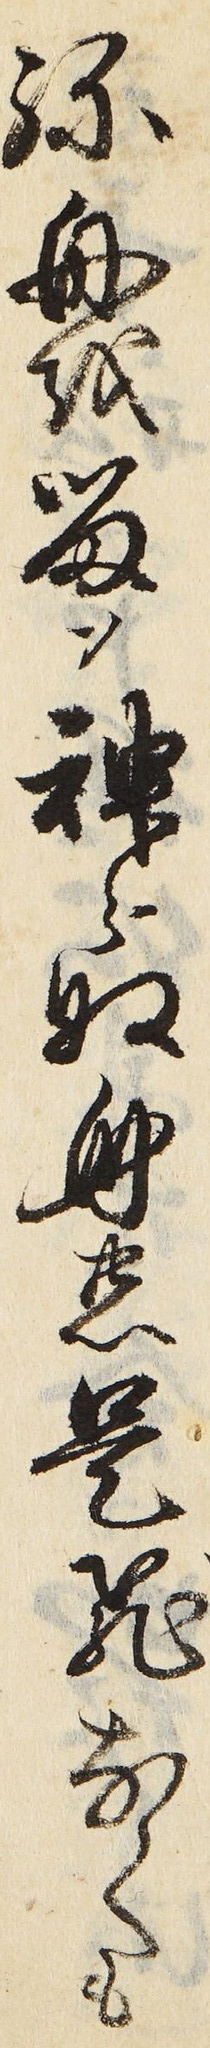弥舟を留め神らぬ身の是飛なくも
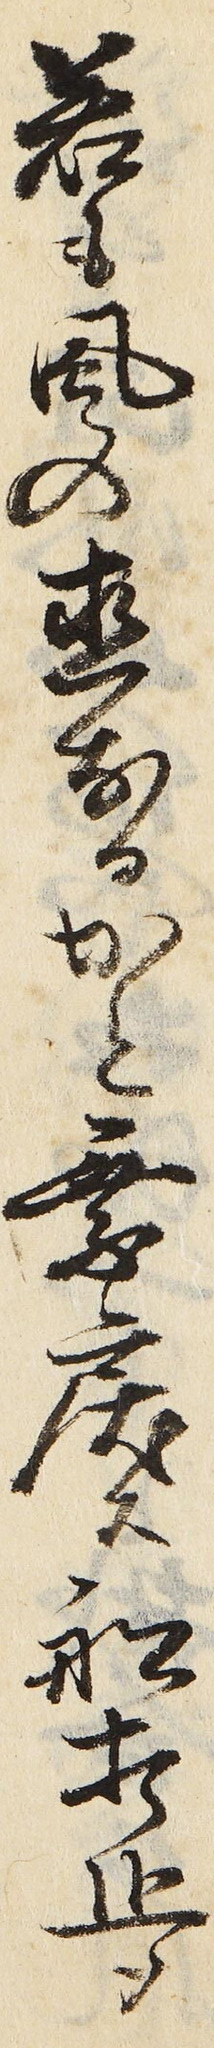若も風の直なるかと乗戻す船打止め
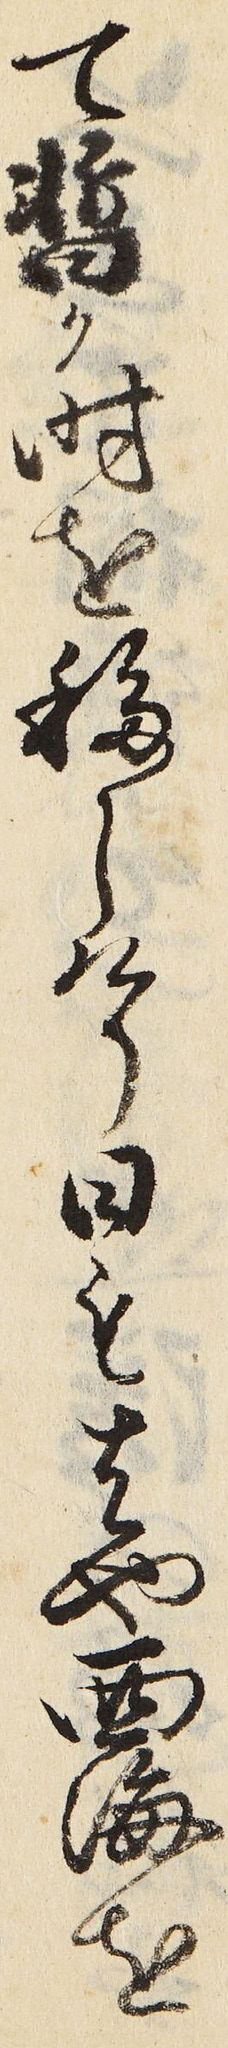て暫く時を移しけり日もはや西海を
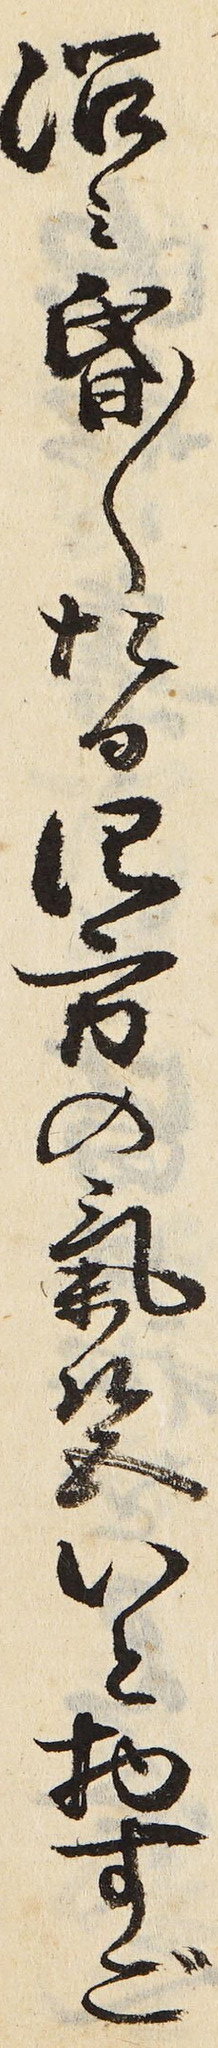溜み昏〳〵たる四方の気色いと物すご
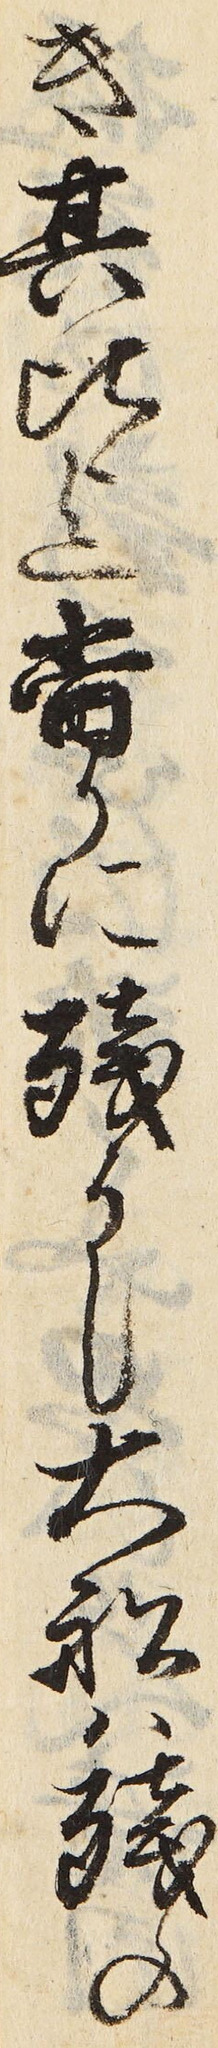き其比迠当りに残りし大船は残の
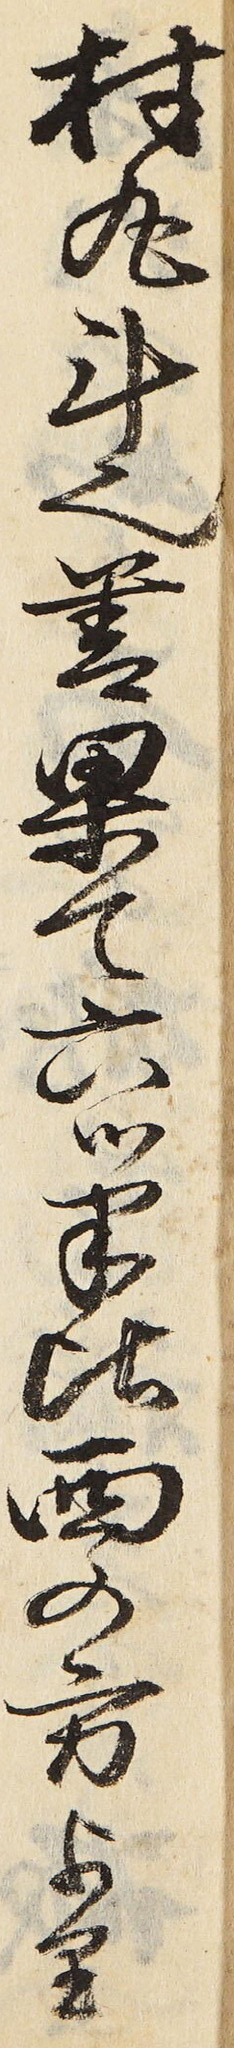村丸計也暮果て六つ半比西の方より
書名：華夷九年録
